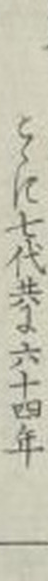こゝに七代共に六十四年
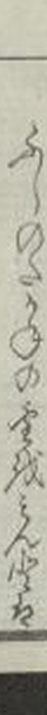ふしのたかねの雲をみんとは
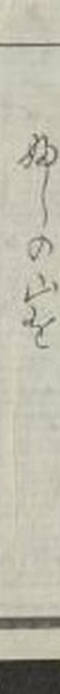ふしの山を
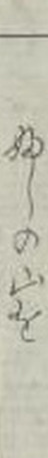ふしの山を
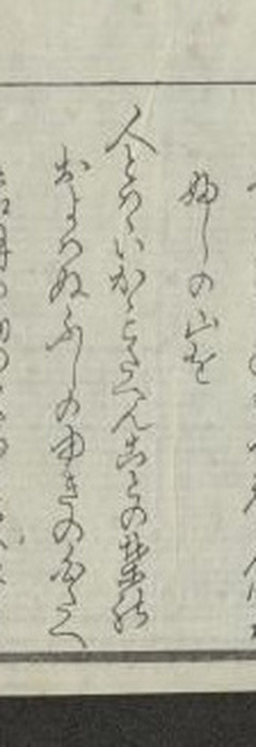人とはゝいかゝこたへんことの葉の
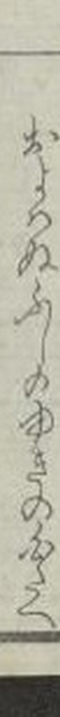およはぬふしのゆきの国たへ
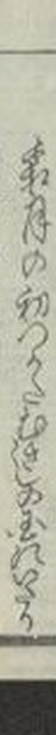霜月の初つかたむきしの国のいたり
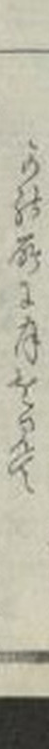かの所に月を見て
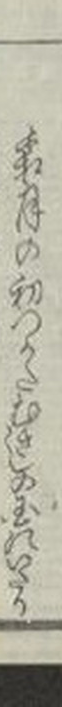霜月の初つかたむきしの国のいたり
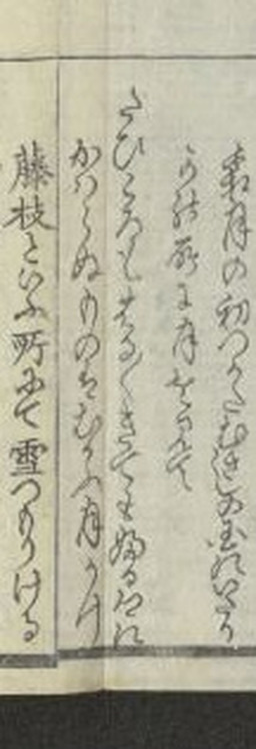たひころもはる〳〵きてもふるに
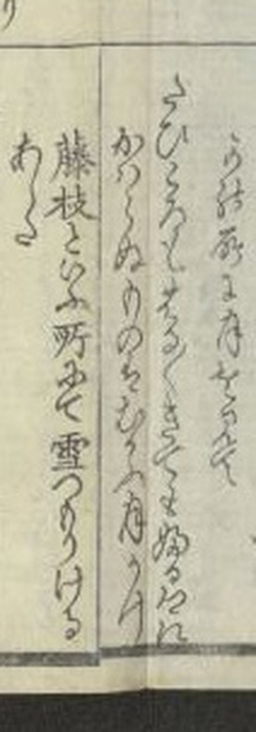かはらぬものはむかふ月かけ
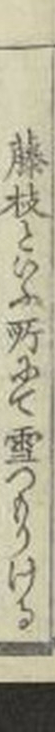藤枝といふ所にて雪つもりける
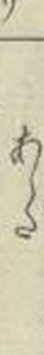あした
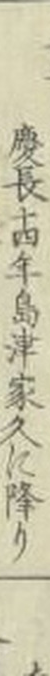慶長十四年島津家久に降り
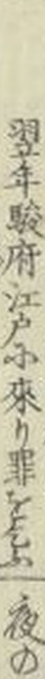翌年駿府江戸に来り罪を乞ふ
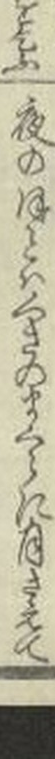夜の月とはくさのまくらに月さえて
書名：中山国使略
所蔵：University of the Ryukyus Library
